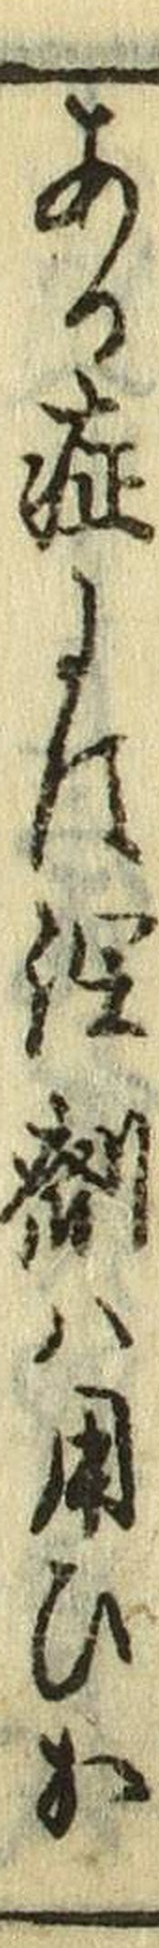ある症には潤剤は用ひが
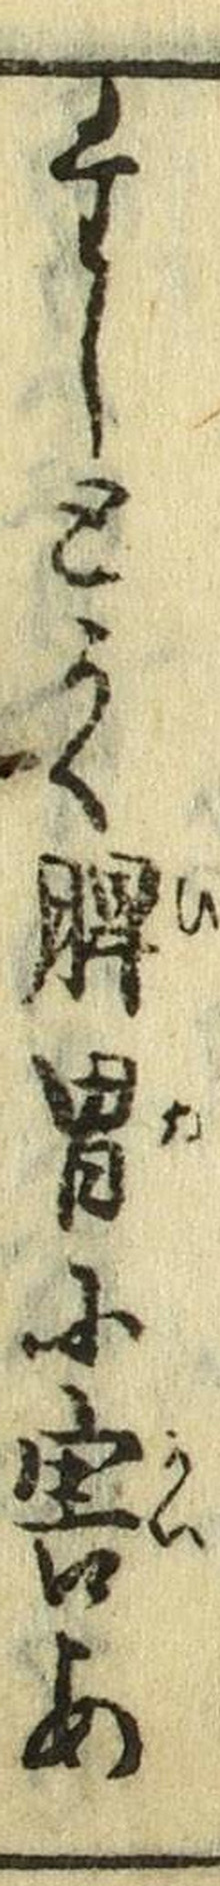たしとかく脾胃に害あ
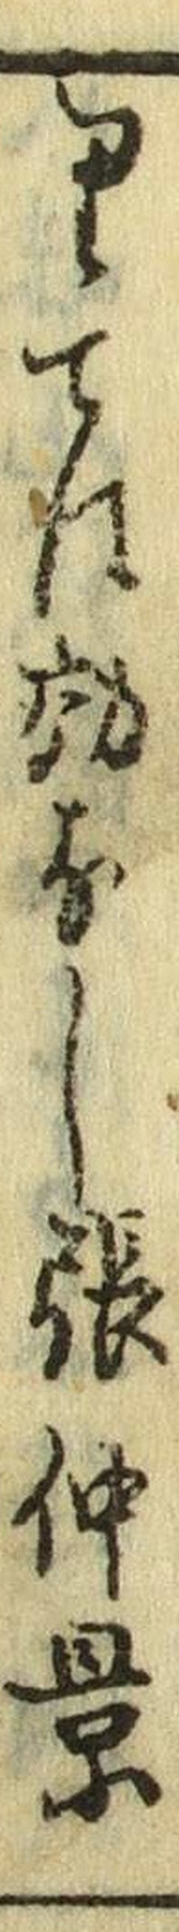りては効なし張仲景

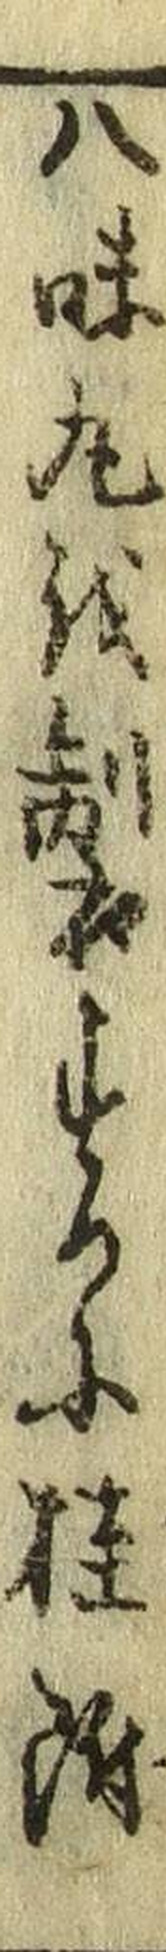八味丸を製するに桂附
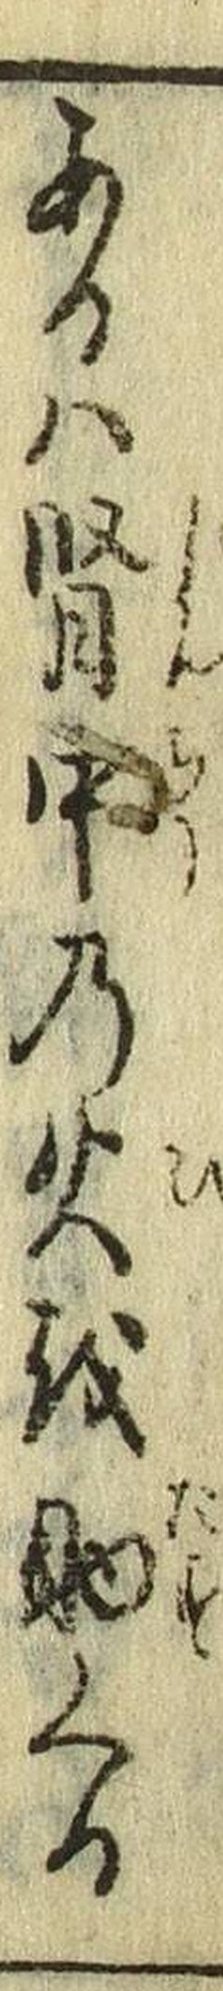あるは腎中の火を助くる
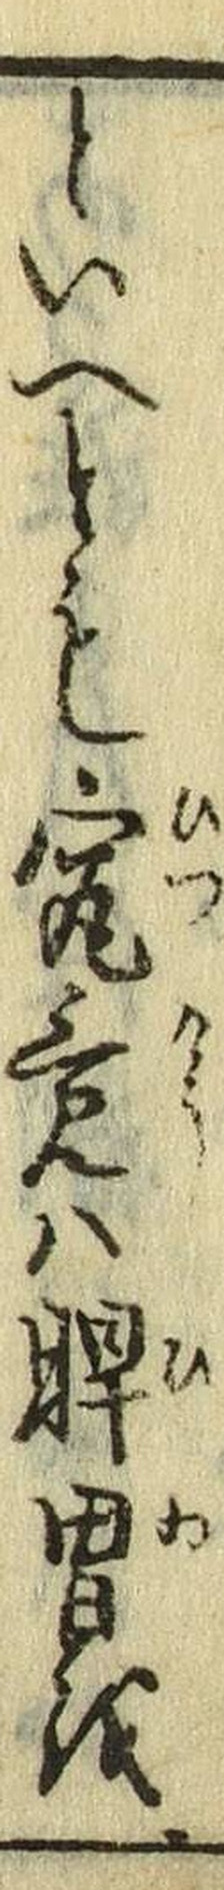といへとも究竟は脾胃を
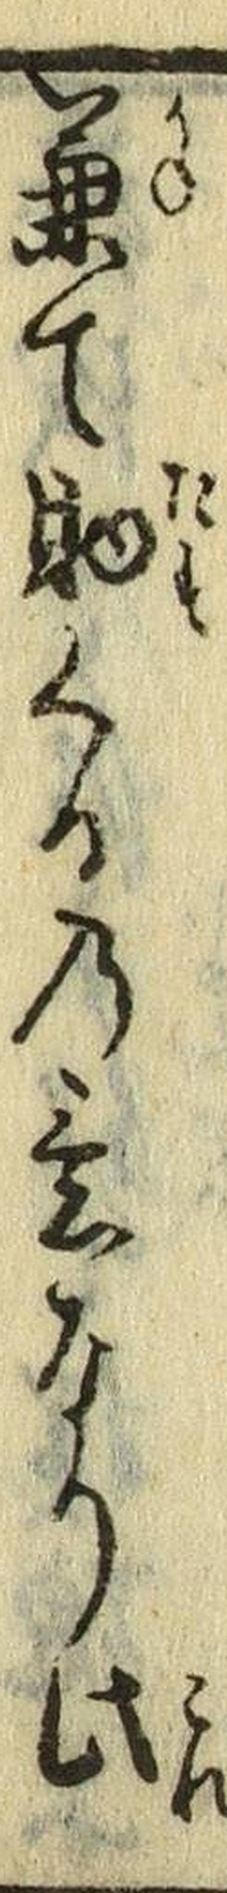兼て助くるの意なり此
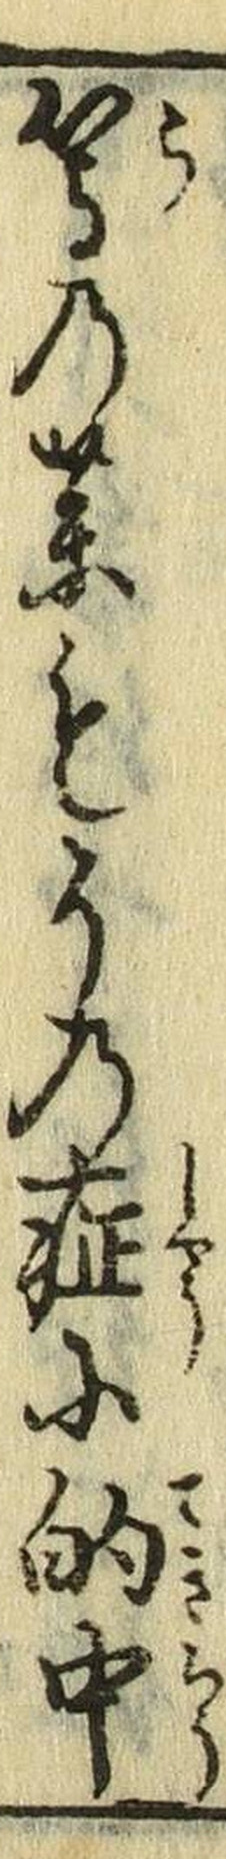等の薬もその症に的中
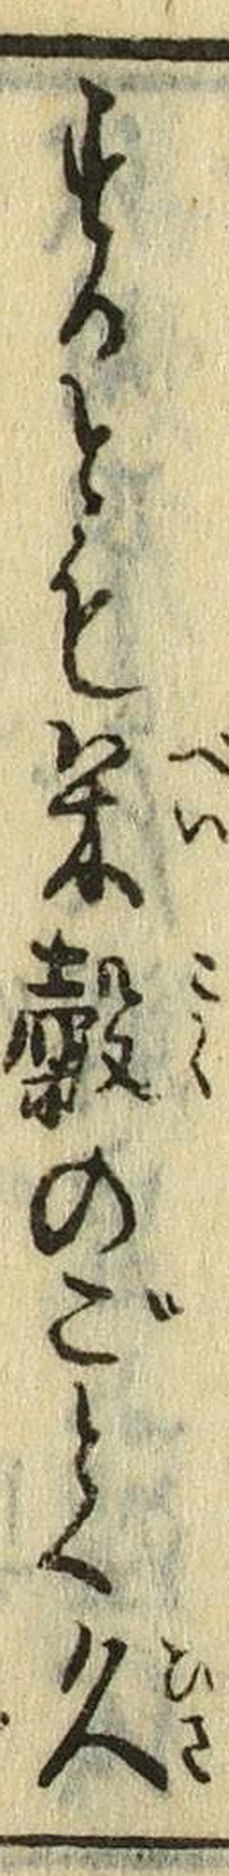するとも米穀のごとく久
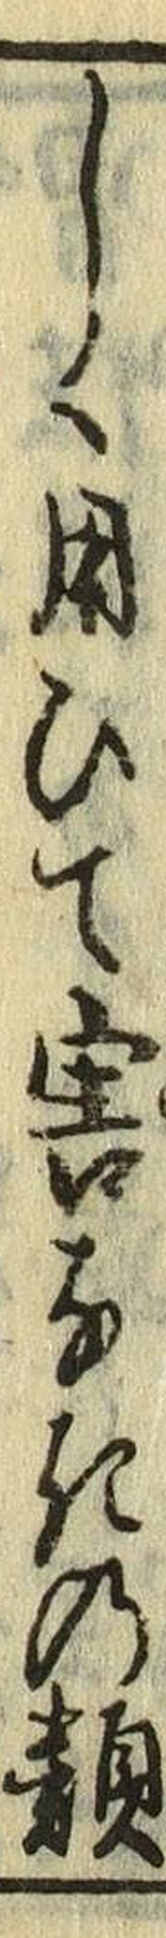しく用ひて害なきの類
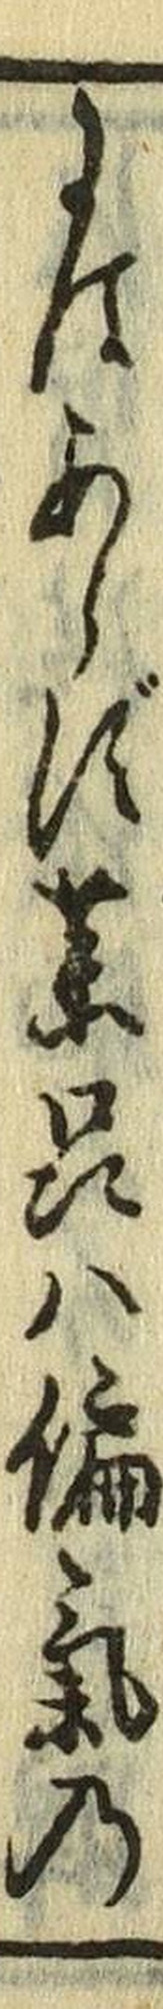にはあらず薬品は偏気の
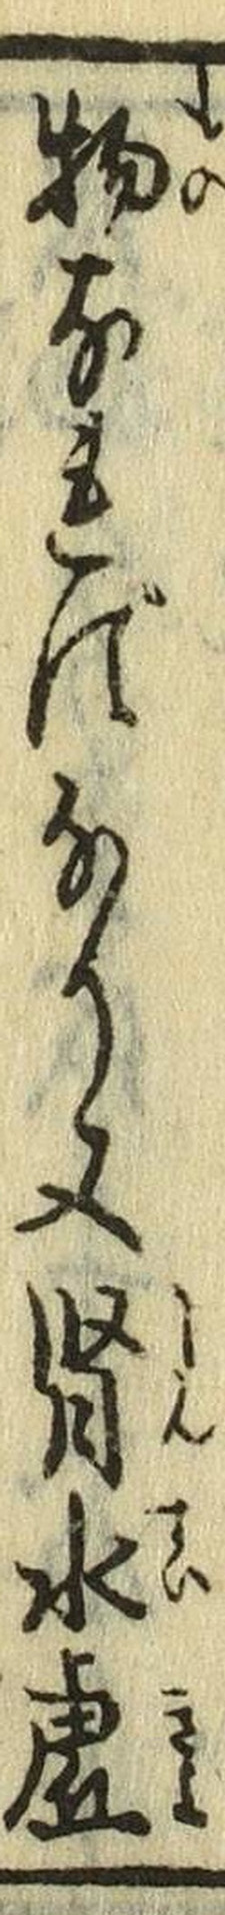物なればなり又腎水虚
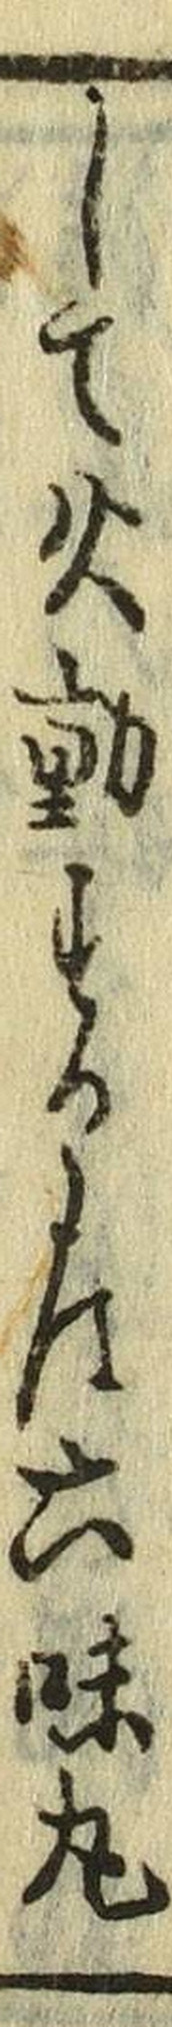して火動するには六味丸
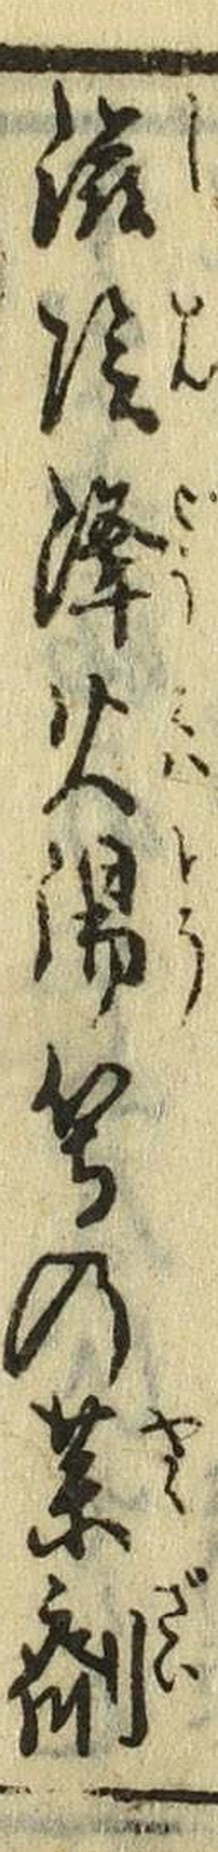滋陰降火湯等の薬剤
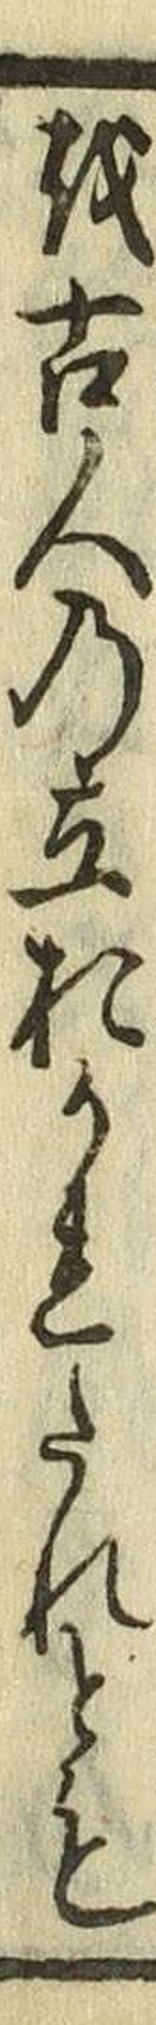を古人の立おかれたれとも
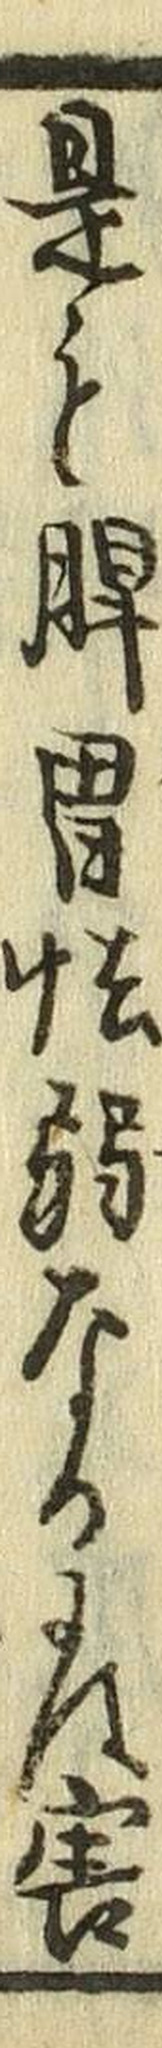是も脾胃怯弱なるには害
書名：居家養生記
